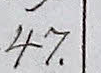47.
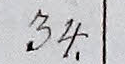34.
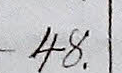48.
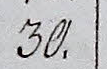30.
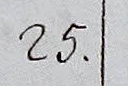25.
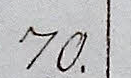70.
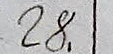28.
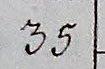35
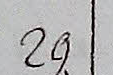29.
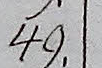49.
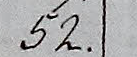52.
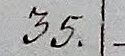35.
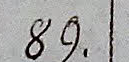89.
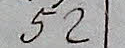52
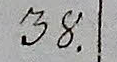38.
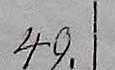49.
